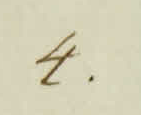4.
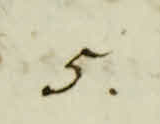5.
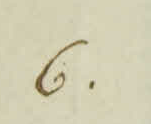6.
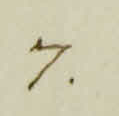7.
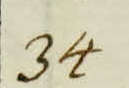34
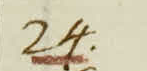24.
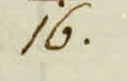16.
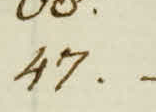47.
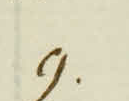9.
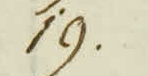19.
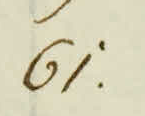61.
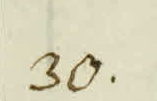30.
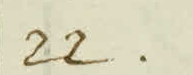22.
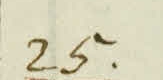25.
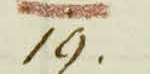19.
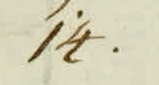14.
